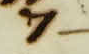7
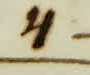4
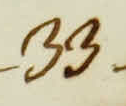33
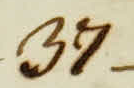37
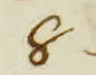8
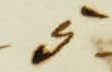5
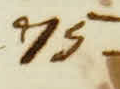75
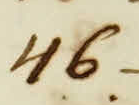46
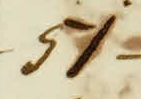51
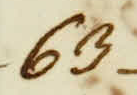63
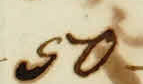50
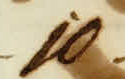10
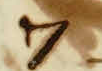7
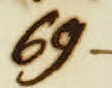69
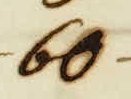60
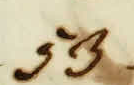53
